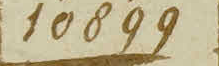10899
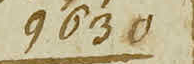9630
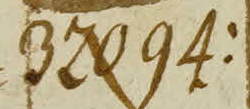32094
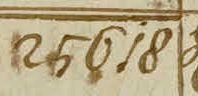25618
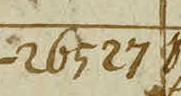26527
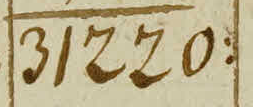31220
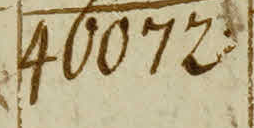46072
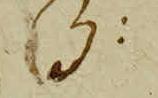3:
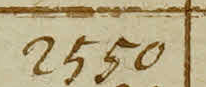2550
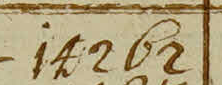14262
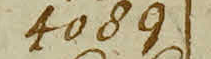4089
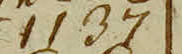1137
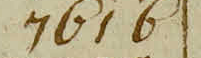7616
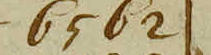6562
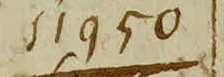11950
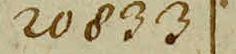20833
